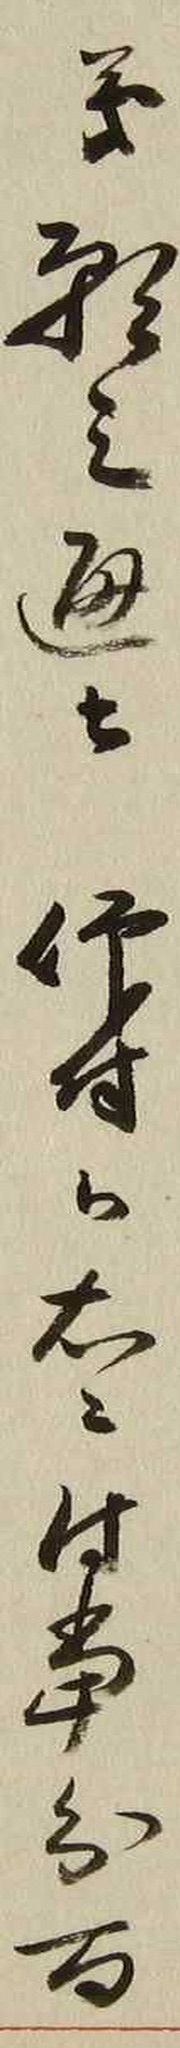義願之通被仰付候右ニ付当分百
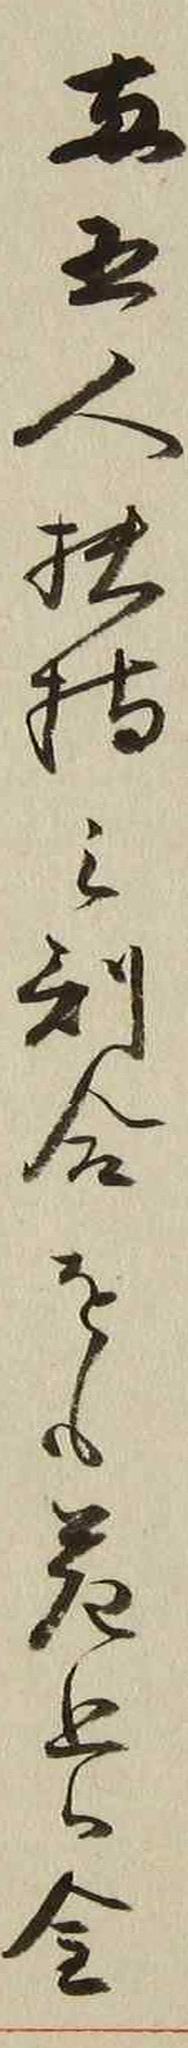両五人扶持之割合をも差上候金
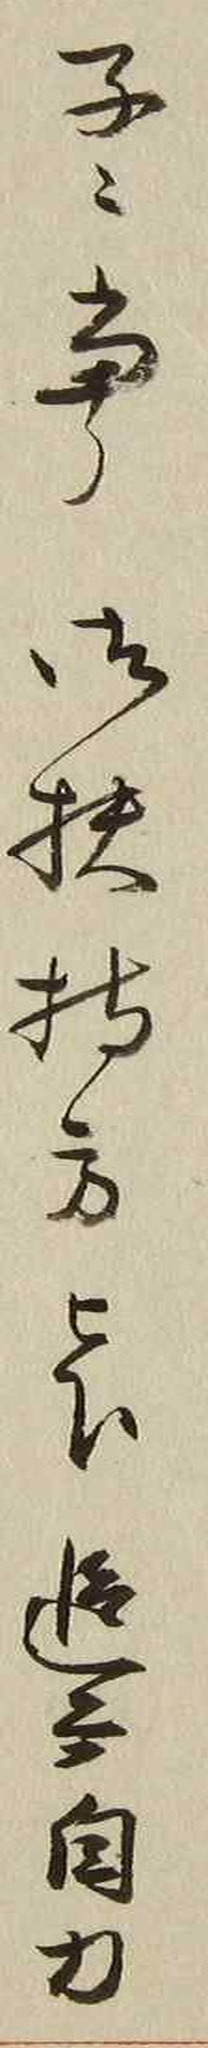子ニ当り御扶持方被下追而自力
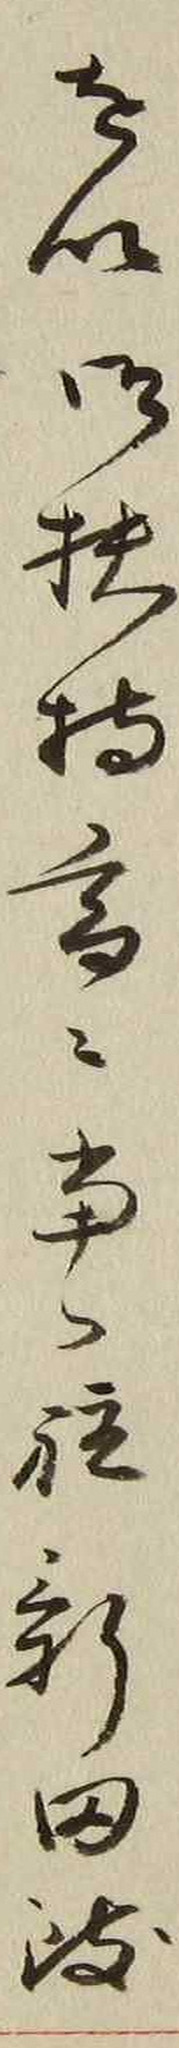を以御扶持高ニ当候程新田致
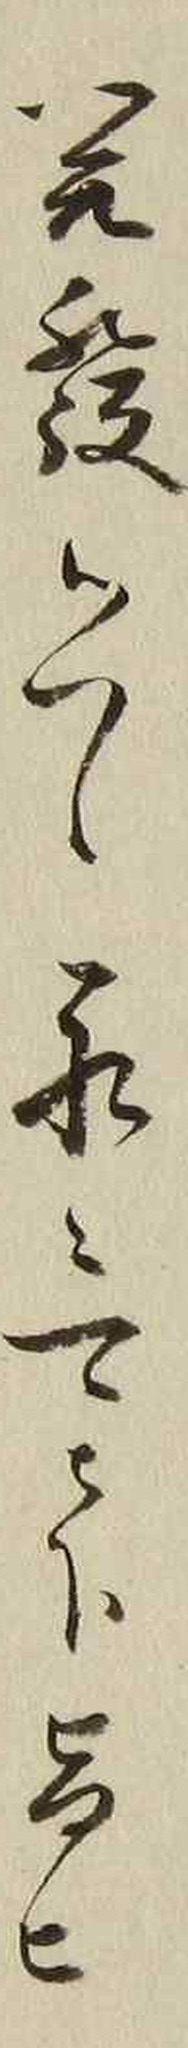開発候ハヽ永々可被下旨被
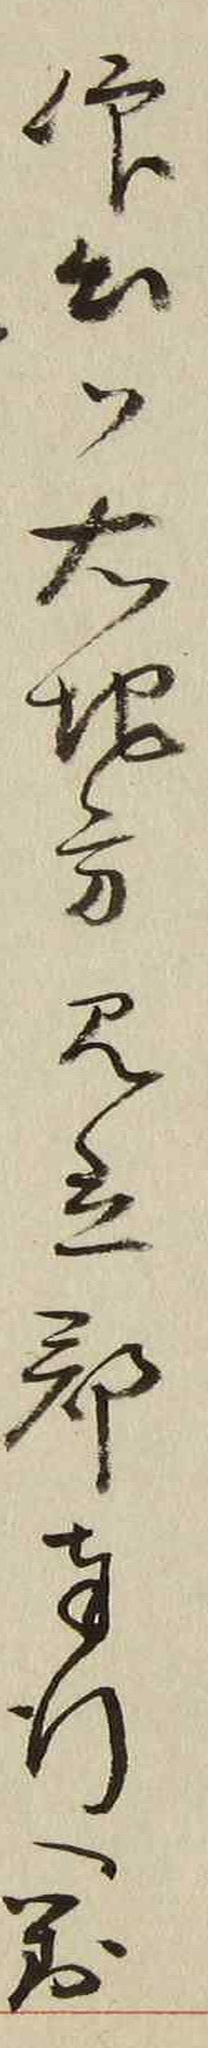仰出候右地方見立郡奉行へ対
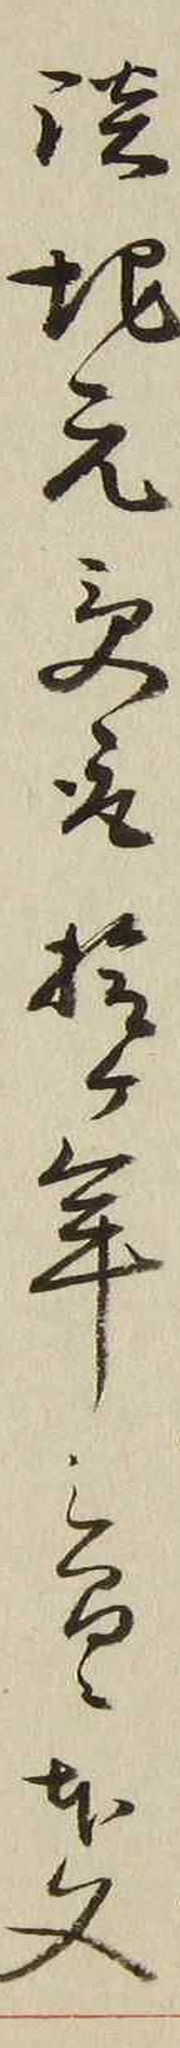談地元受取拾ヶ年之間ニ本文
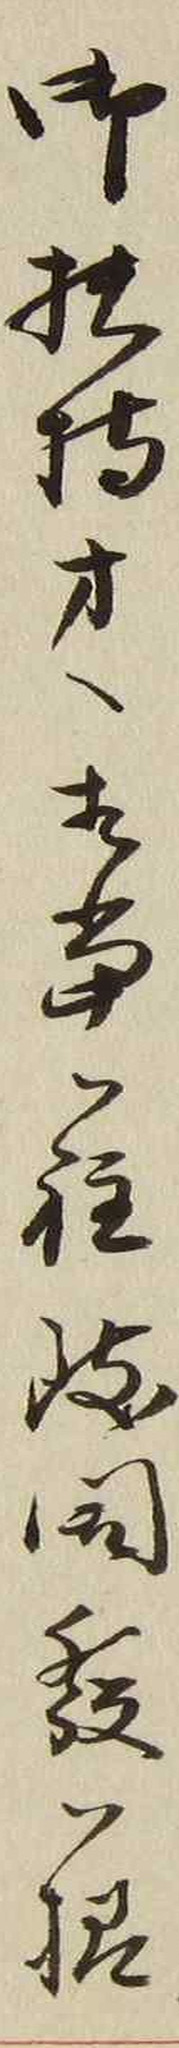御扶持方へ相当候程致開発候様
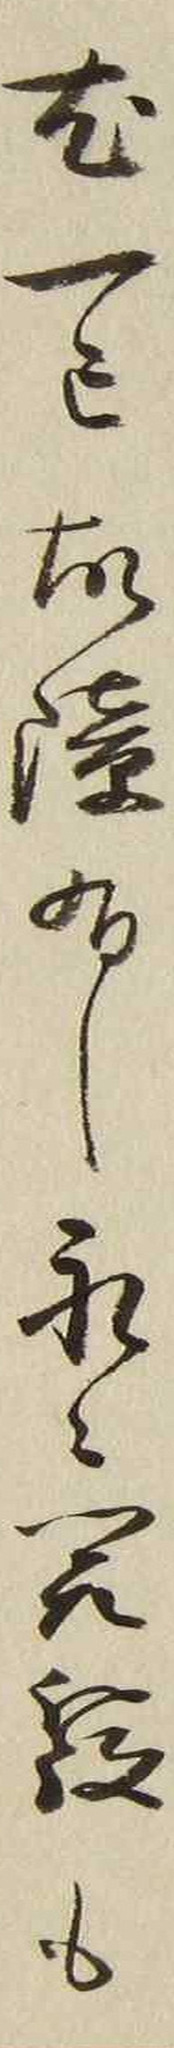尤一己故障有之永々開発も
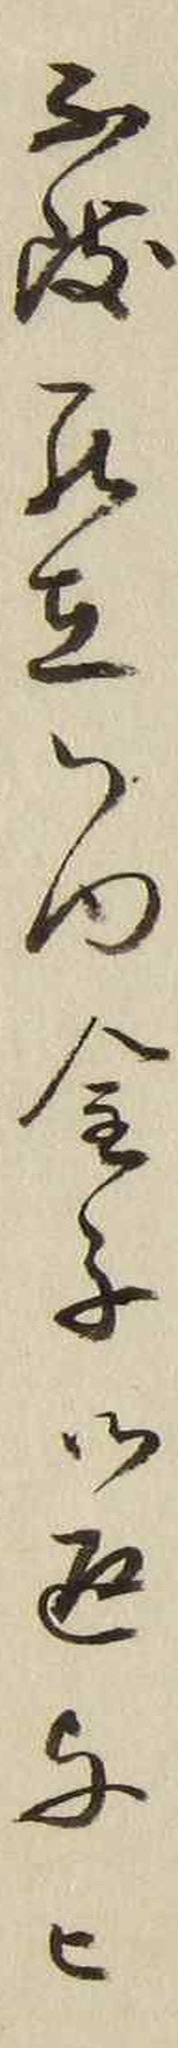不致罷在候内金子御返与被

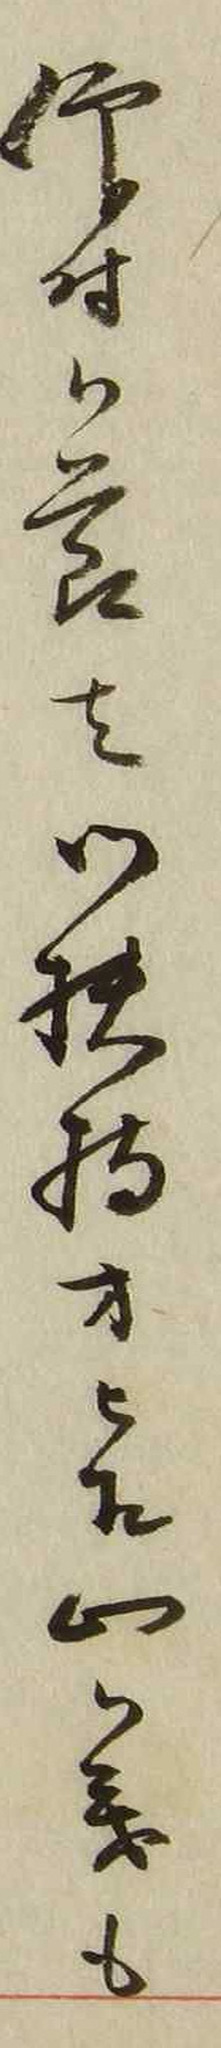仰付候節は御扶持方被相止候義も
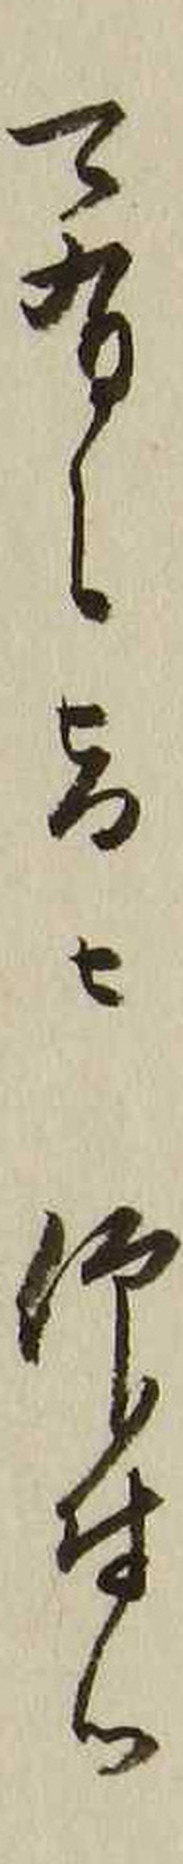可有之旨被仰付候
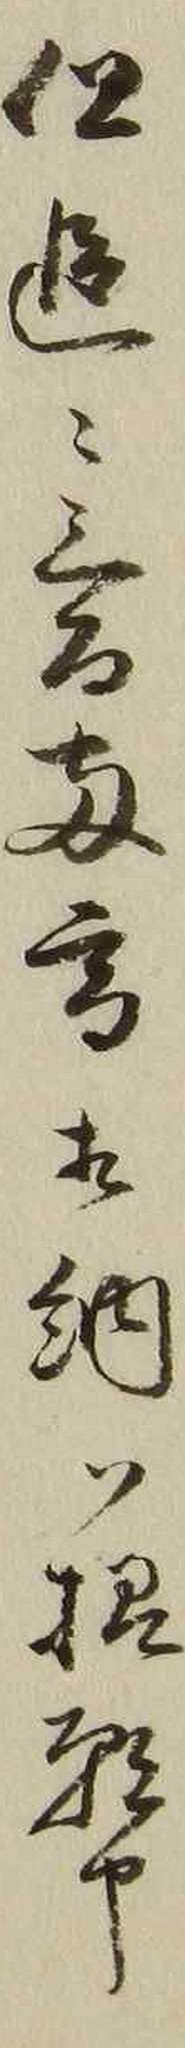但追々三百両高相納候様願申
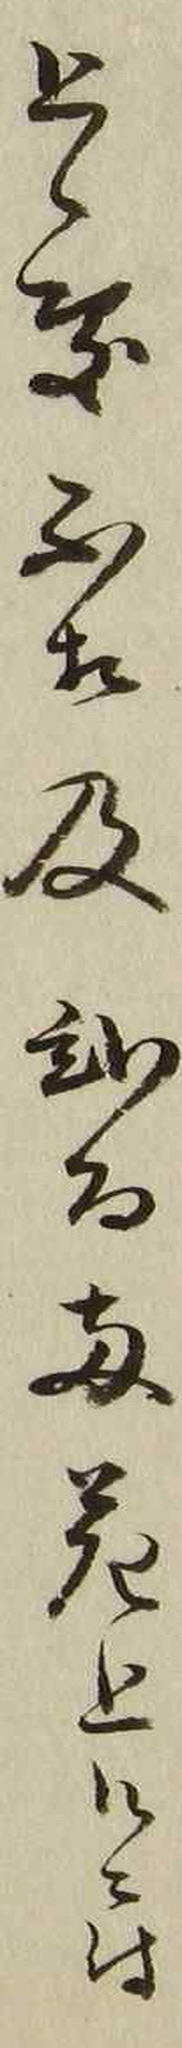上候処不相及弐百両差上候ニ付
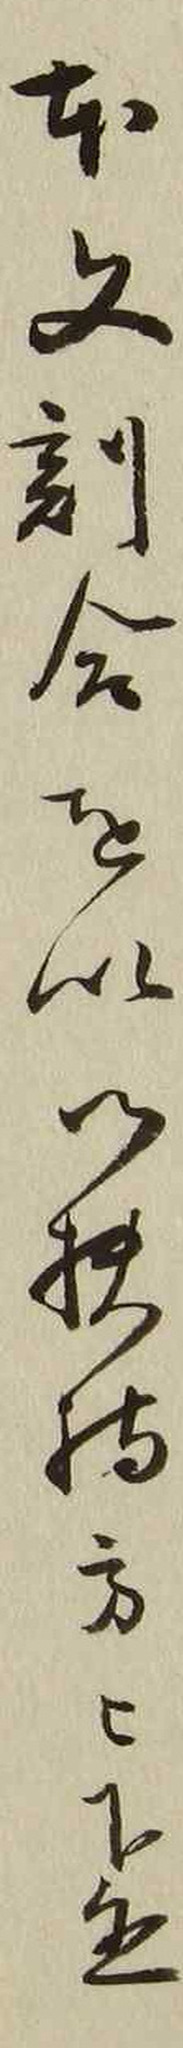本文割合を以御扶持方被下置
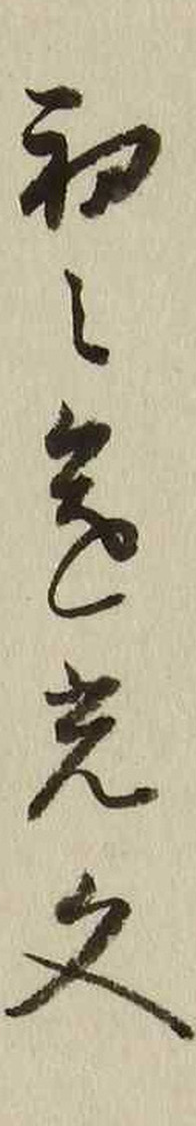初之進光文
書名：諸士系譜　巻之288　さ之部20
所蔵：会津若松市立会津図書館
